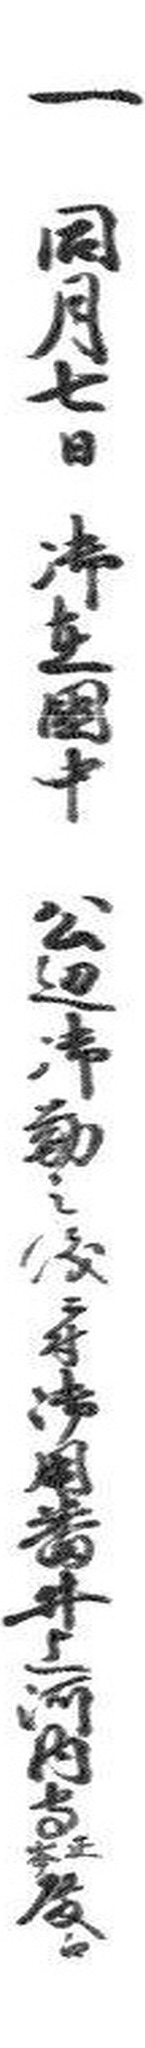一同月七日御在国中公辺御勤之儀ニ付御用番井上河内守正岑殿江
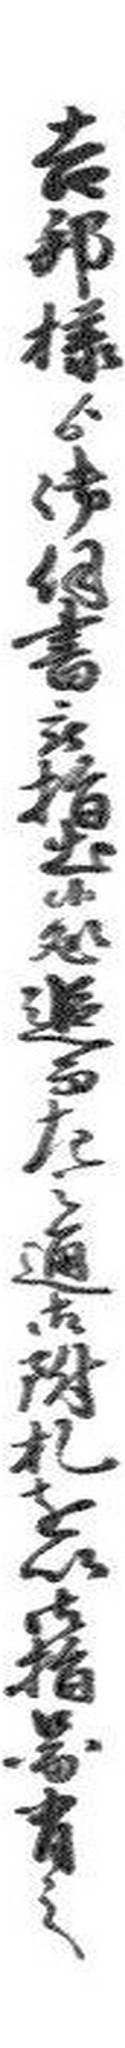吉邦様ゟ御伺書被指出候処追而左之通附札を以御指図有之

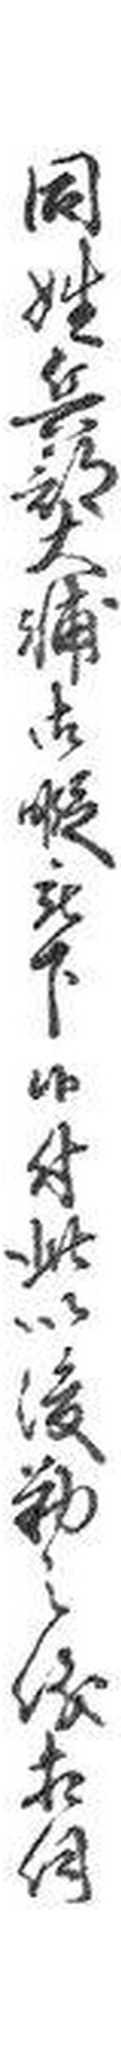同姓兵部大輔御暇被下候付此以後勤之儀相伺申候
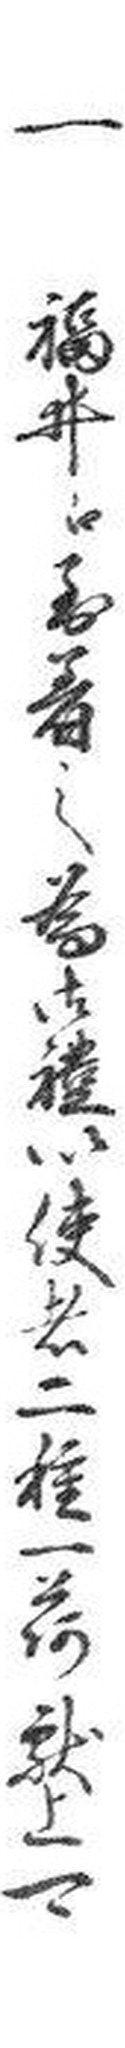一福井江到着之為御礼以使者二種一荷献上可
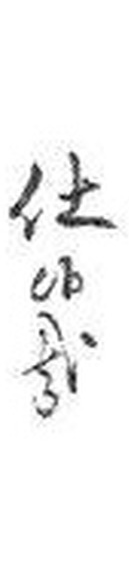仕候哉
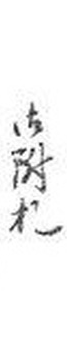御附札
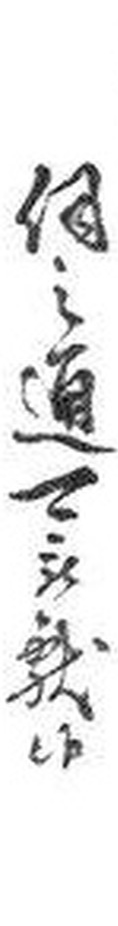伺之通可被献候
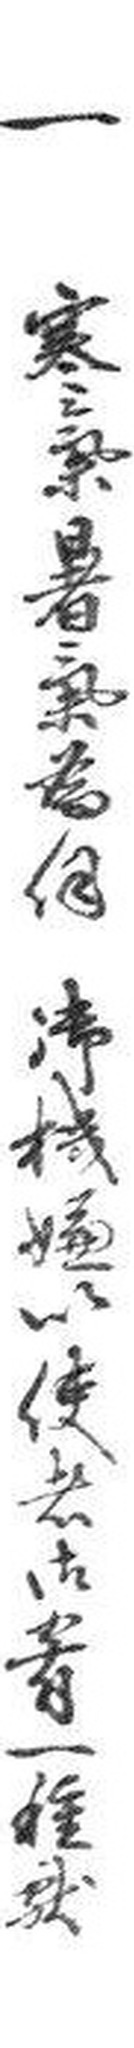一寒気暑気為伺御機嫌以使者御肴一種献
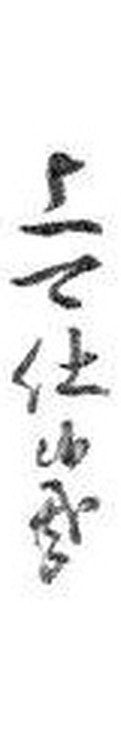上可仕候哉
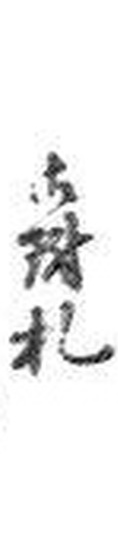御附札
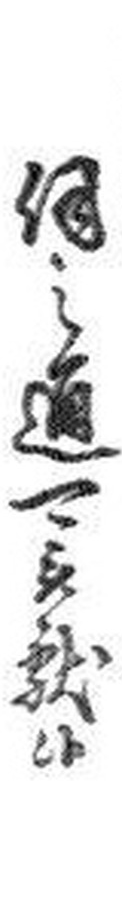伺之通可被献候
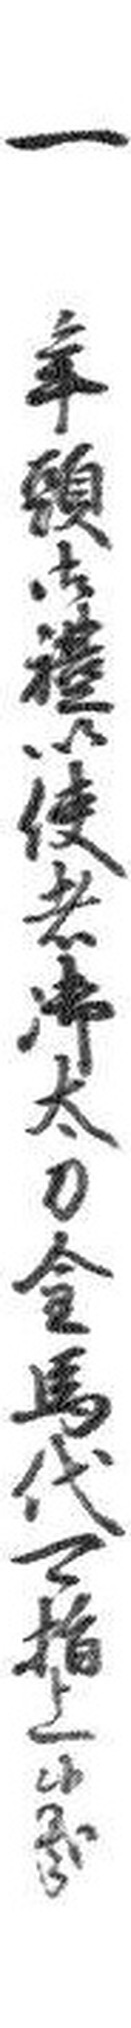一年頭御礼以使者御太刀金馬代可指上候哉
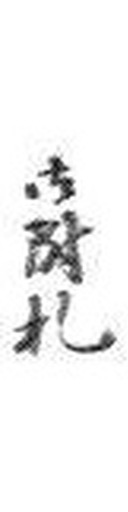御附札
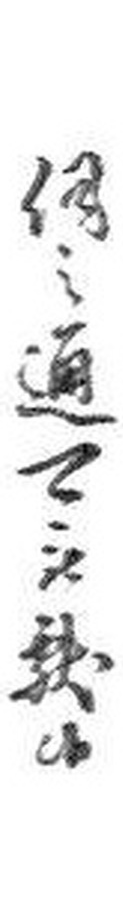伺之通可被献候
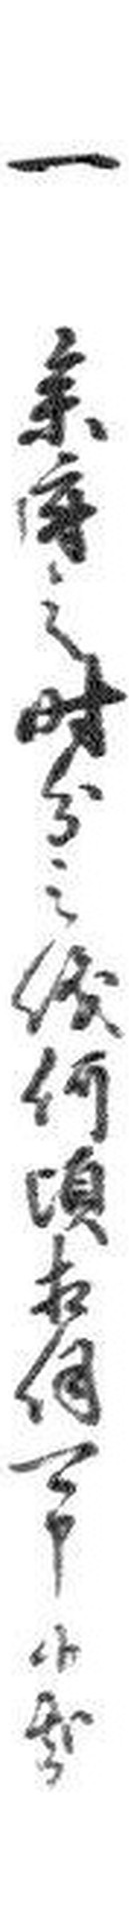一参府之時分之儀何頃相伺可申候哉
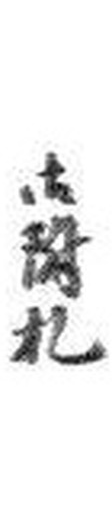御附札
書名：家譜 二十六 吉品公 従宝永七年到正徳二年
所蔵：福井県文書館 Fukui Prefectural Archives
